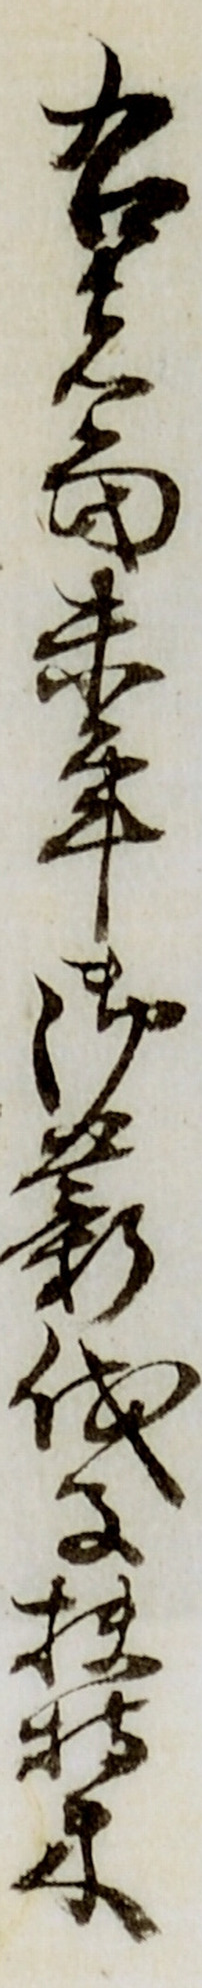右は当未年御薪伐子扶持米
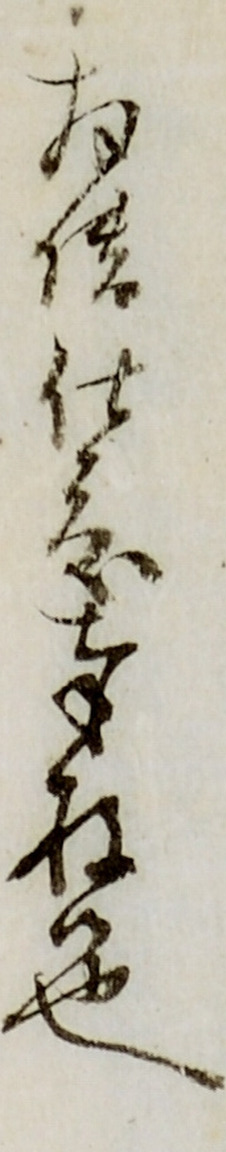拝借仕度奉存候也
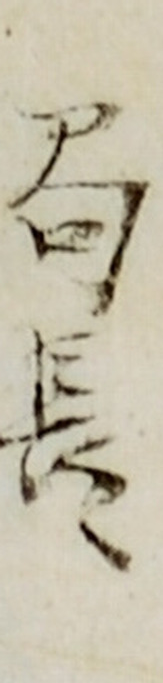局長へ
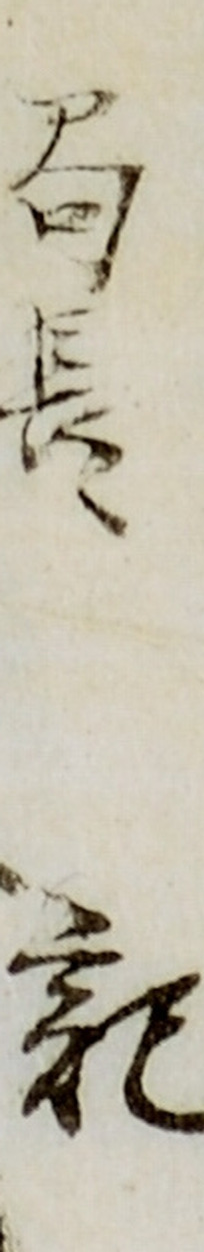局長へ
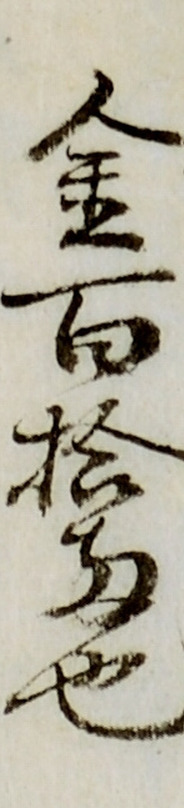金百拾両也
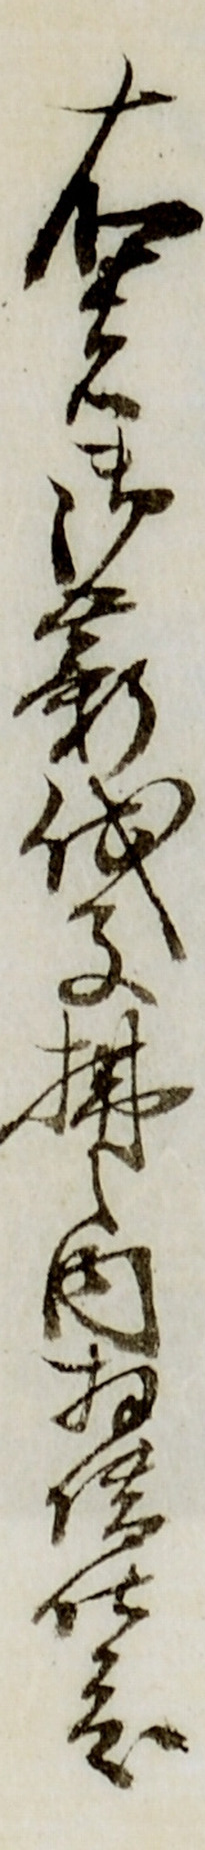右は御薪伐子払之内拝借仕度
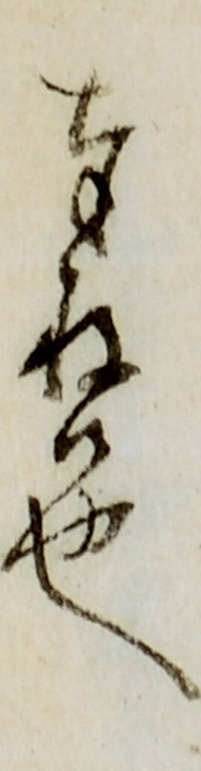奉存候也
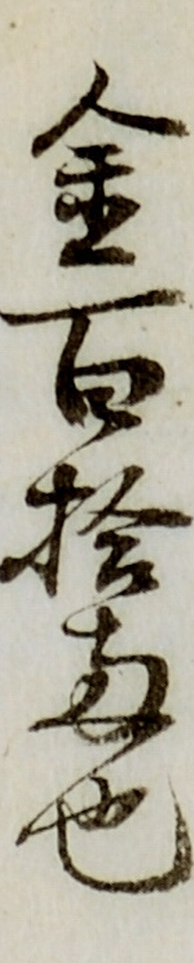金百拾両也
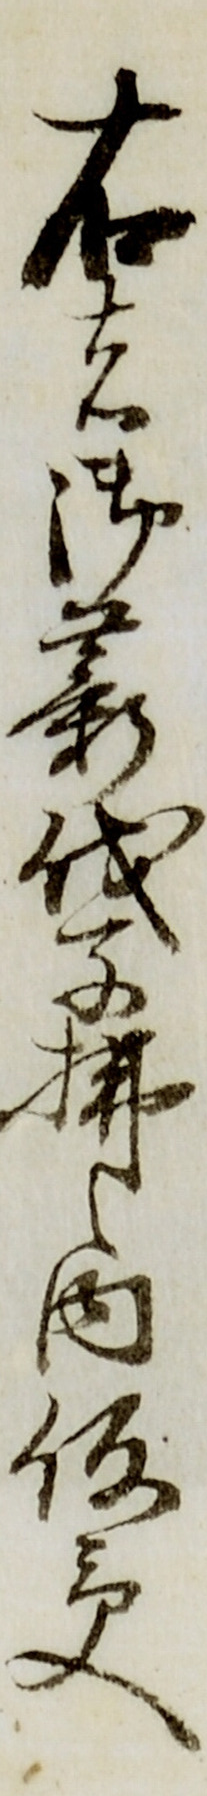右は御薪伐子払之内仮受
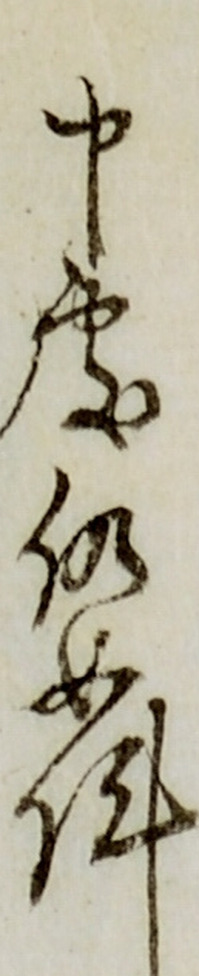申処仍如件
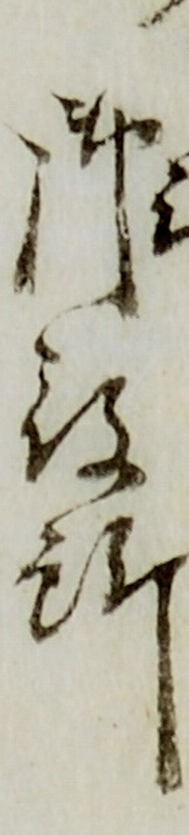御役所
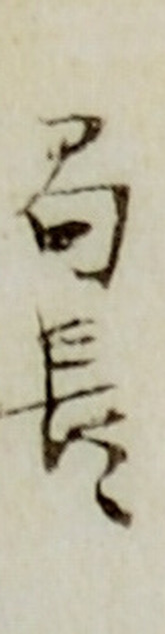局長へ
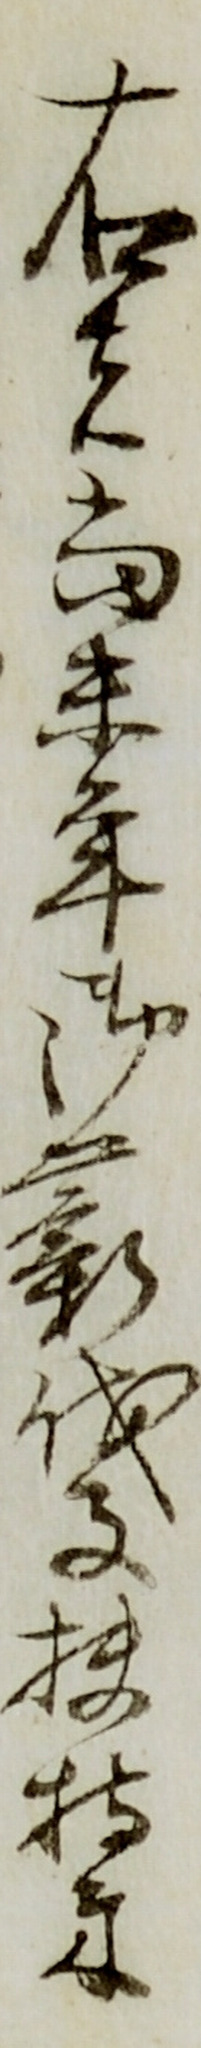右は当未年御薪伐子扶持米
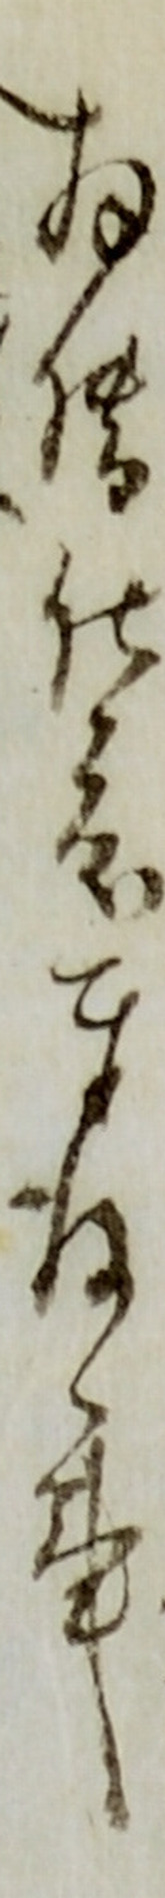拝借仕度奉存候事

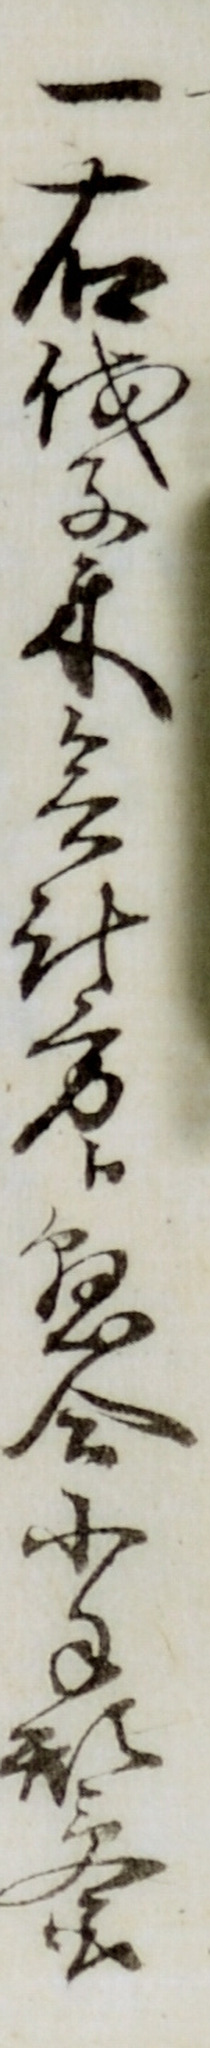一右伐子米会計方え懸合小手形受取
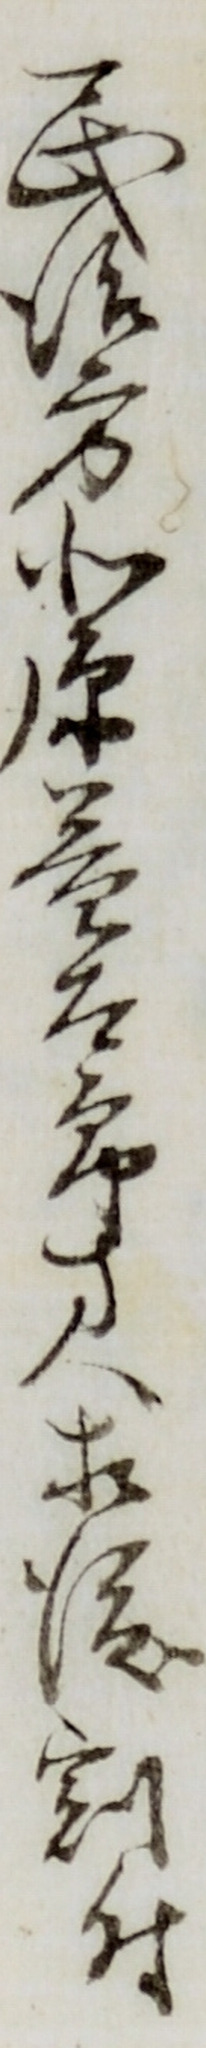民治方北原益太郎方へ相渡割付
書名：山林方諸事御用留
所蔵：伊那市立高遠町図書館・合同会社AMANE
